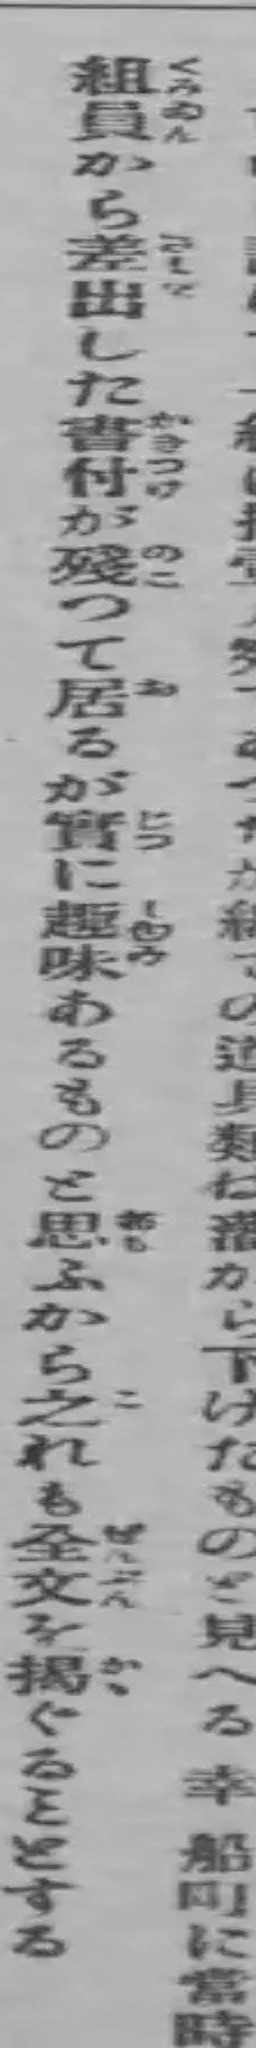組員から差出した書付が残つて居るが実に趣味あるものと思ふから之れも全文を掲ぐることとする
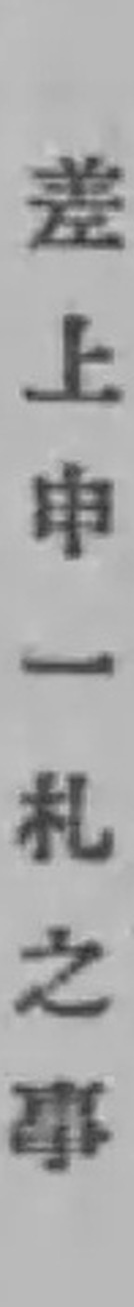差上申一札之事
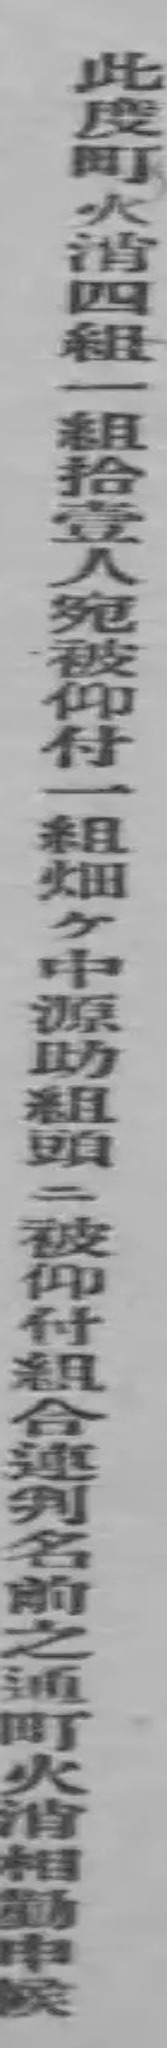此度町火消四組一組拾壱人宛被仰付一組畑ケ中源助組頭ニ被仰付組合連判名前之通町火消相勤申候
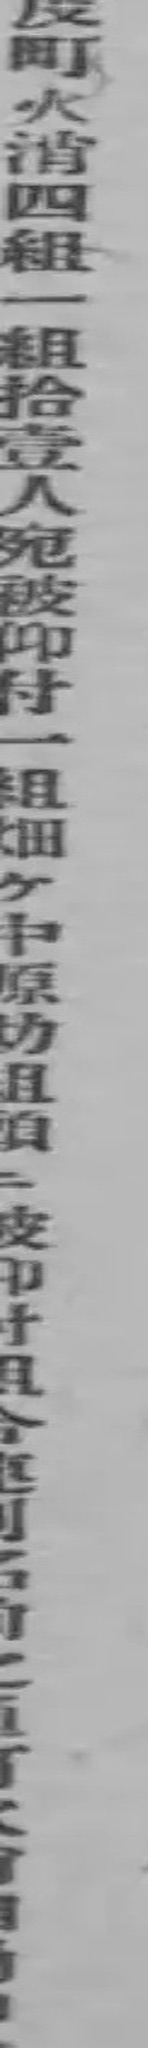此度町火消四組一組拾壱人宛被仰付一組畑ケ中源助組頭ニ被仰付組合連判名前之通町火消相勤申候
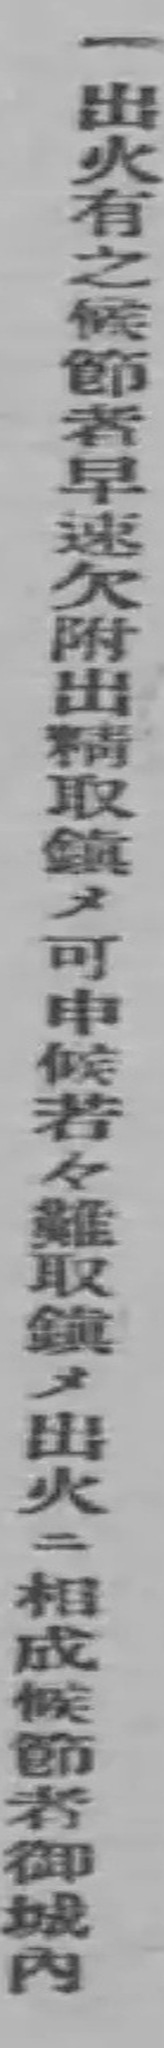一出火有之候節者早速欠附出精取鎮メ可申候若々難取鎮メ出火ニ相成候節者御城内
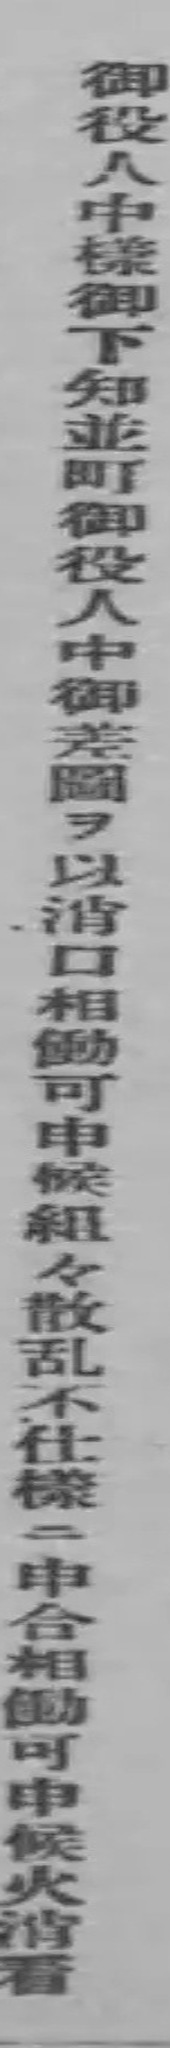御役人中様御下知並町御役人中御差図ヲ以消口相働可申候組々散乱不仕様ニ申合相働可申候火消看
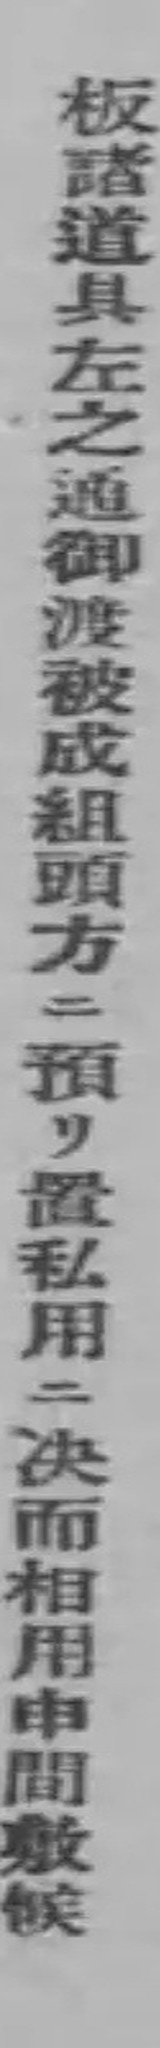板諸道具左之通御渡被成組頭方ニ預リ置私用ニ決而相用申間敷候
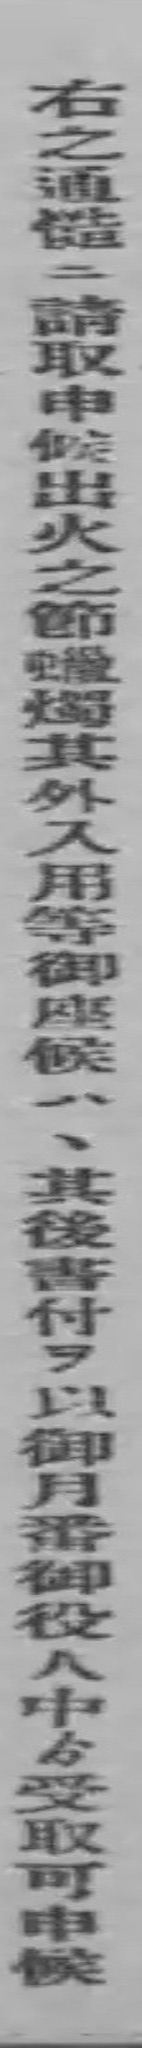右之通慥ニ請取申候出火之節蝋燭其外入用御座候ハヽ其後書付ヲ以御月番御役人中ゟ受取可申候
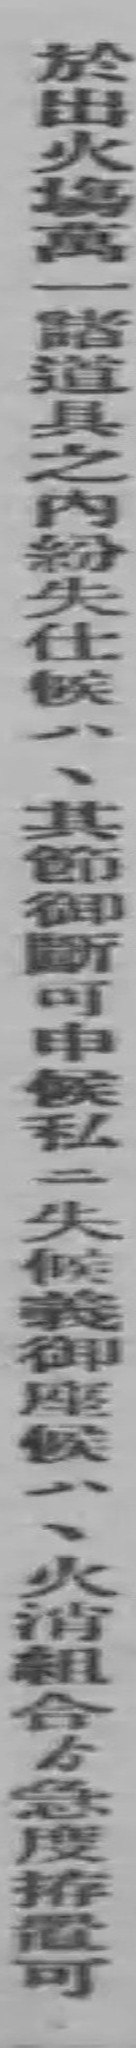於出火場万一諸道具之内紛失仕候ハヽ其節御断可申候私ニ失候義御座候ハヽ火消組合ゟ急度拵置可
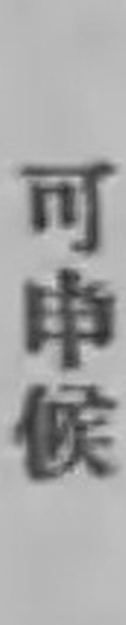可申候
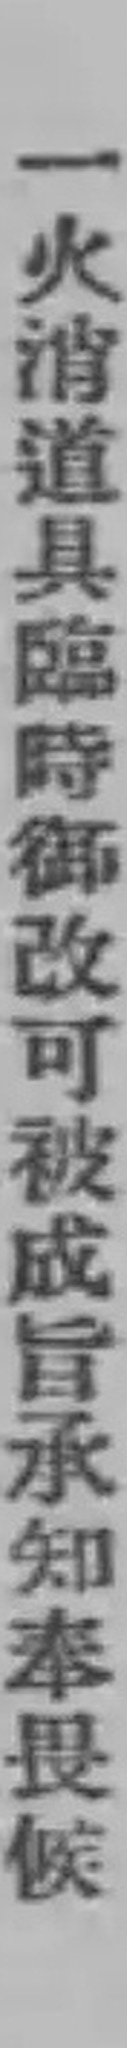一火消道具臨時御改可被成旨承知奉畏候
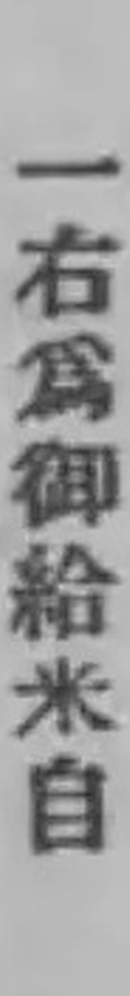一右為御給米自
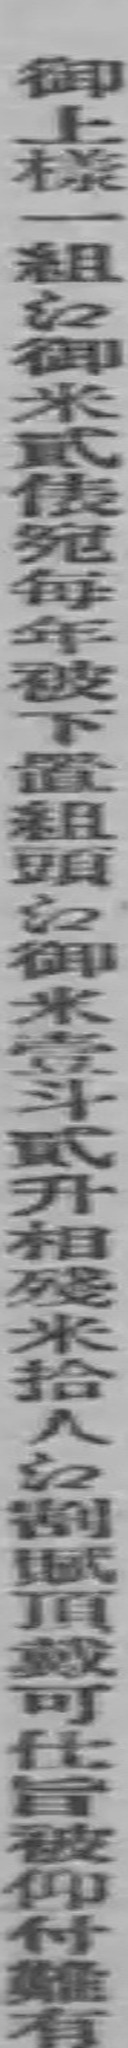御上様一組え御米弐俵宛毎年被下置組頭え御米壱斗弐升相残米拾人え割賦頂戴可仕旨被仰付難有
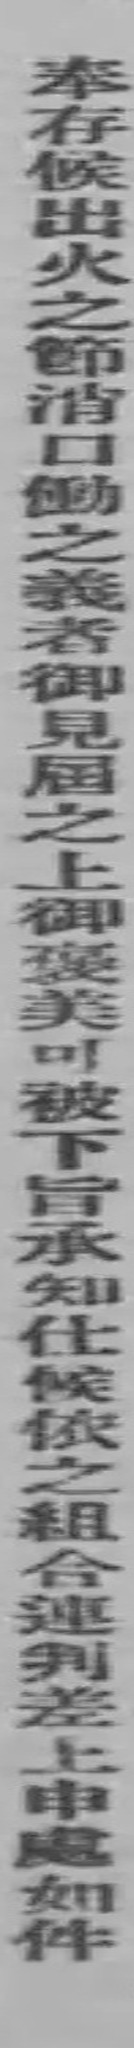奉存候出火之節消口働之義者御見届之上御褒美可被下旨承知仕候依之組合連判差上申処如件
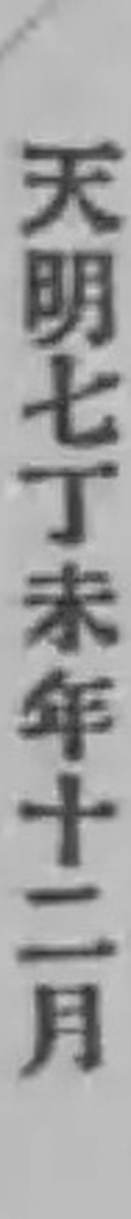天明七丁未年十二月
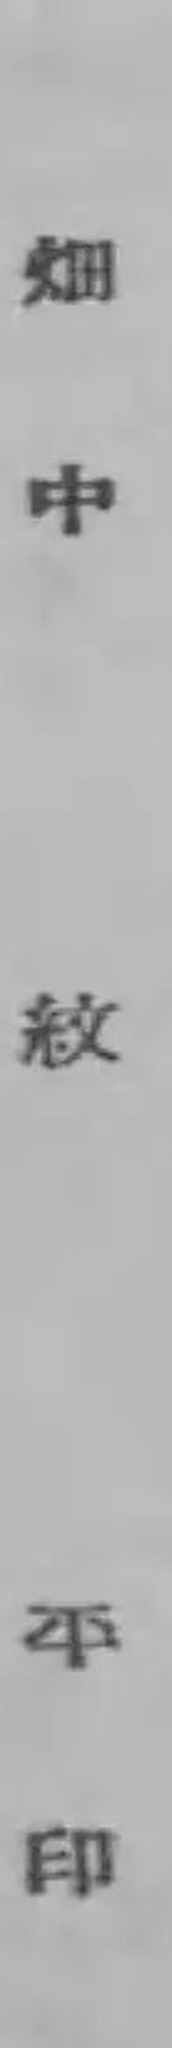畑中紋平印
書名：豊橋市史談
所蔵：国立国会図書館 National Diet Library, JAPAN
